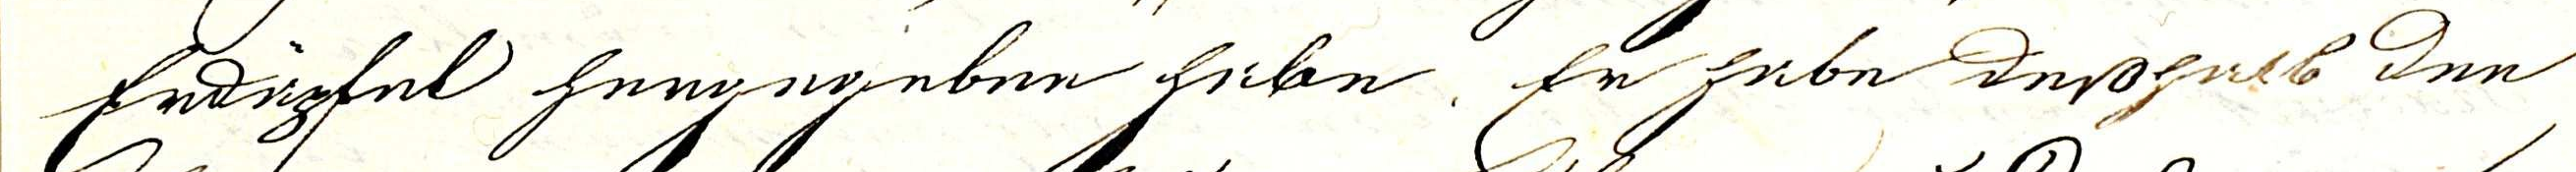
Erdäpfel hergegeben habe. Er habe deßhalb den
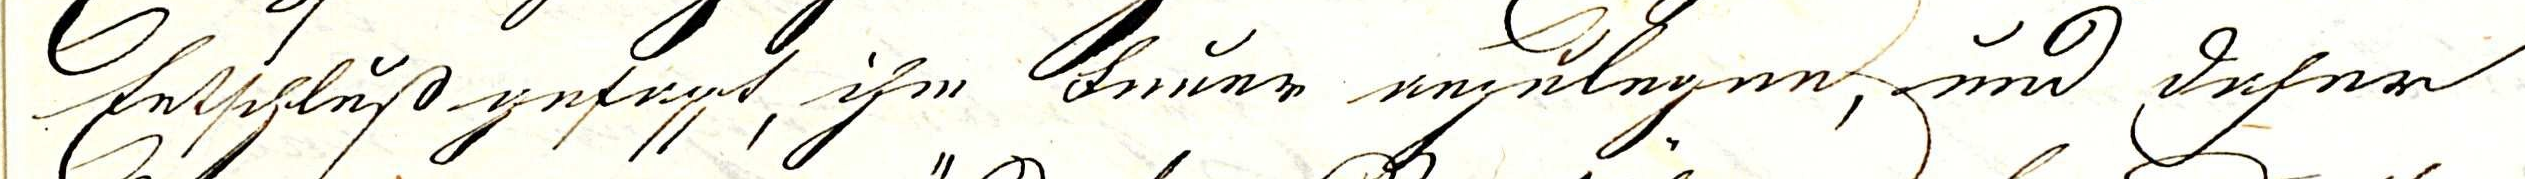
Entschluß gefasst, ihm Feuer anzulegen,
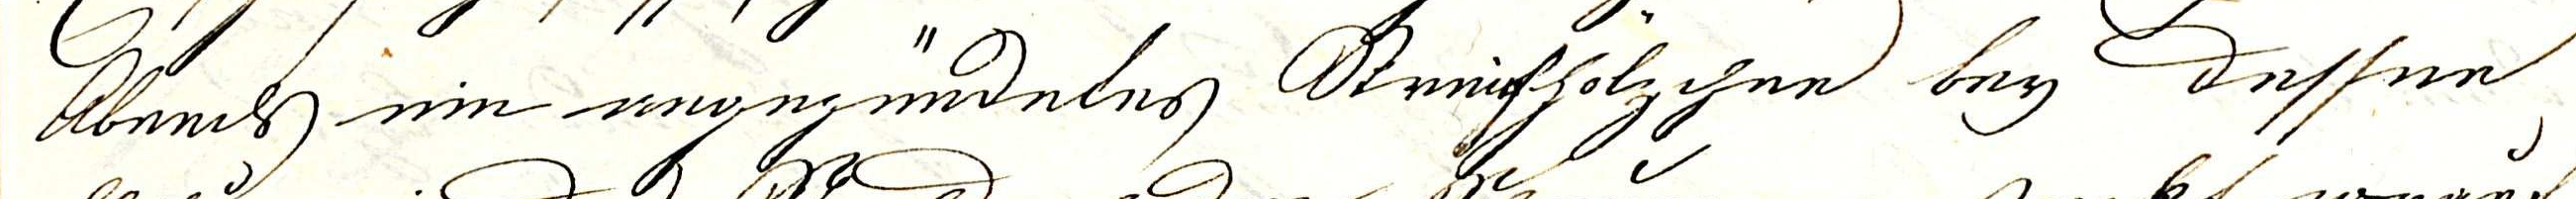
bey dessen
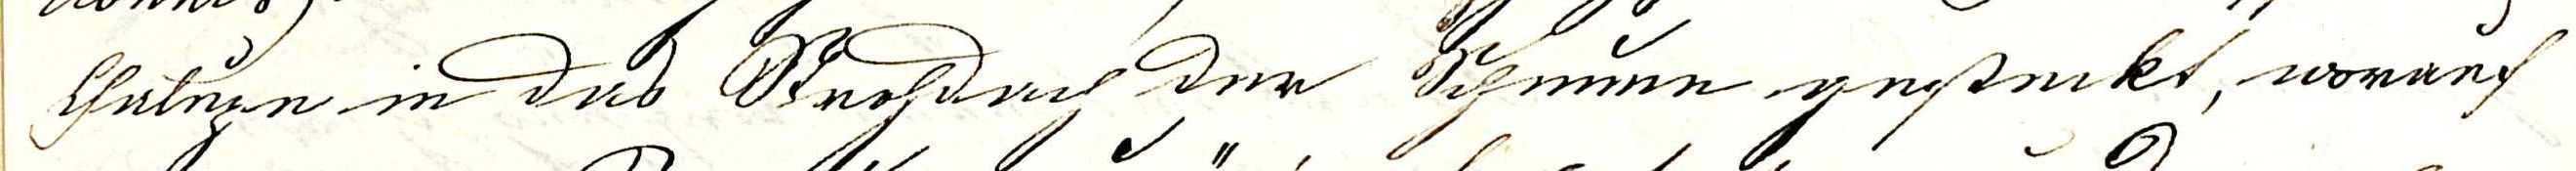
Chalupe in das Strohdach der Scheune gesenkt, worauf
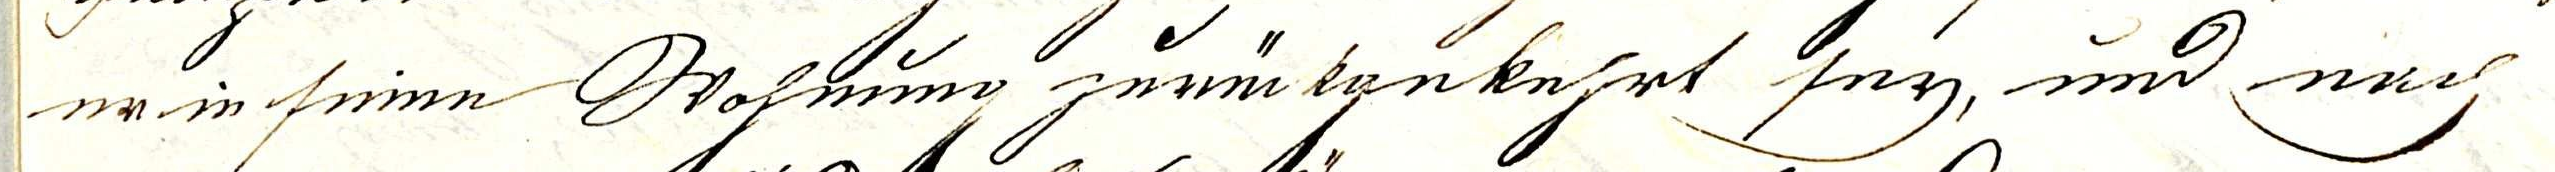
er in seine Wohnung zurückgekehrt sey, und nach
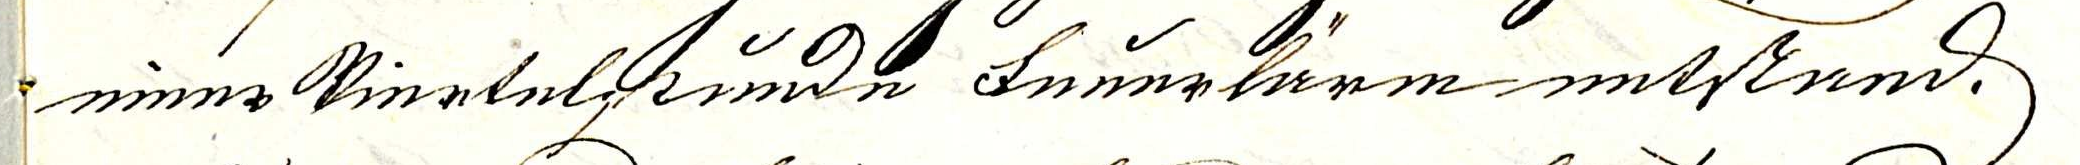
einer Viertelstunde Feuerlärm entstand.
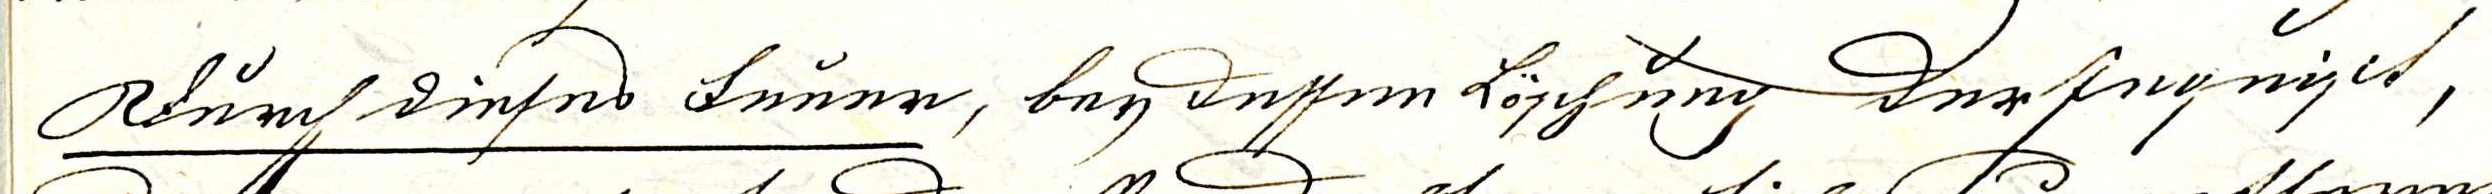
Durch dieses Feuer, bey dessen Löschung der Inquisit,
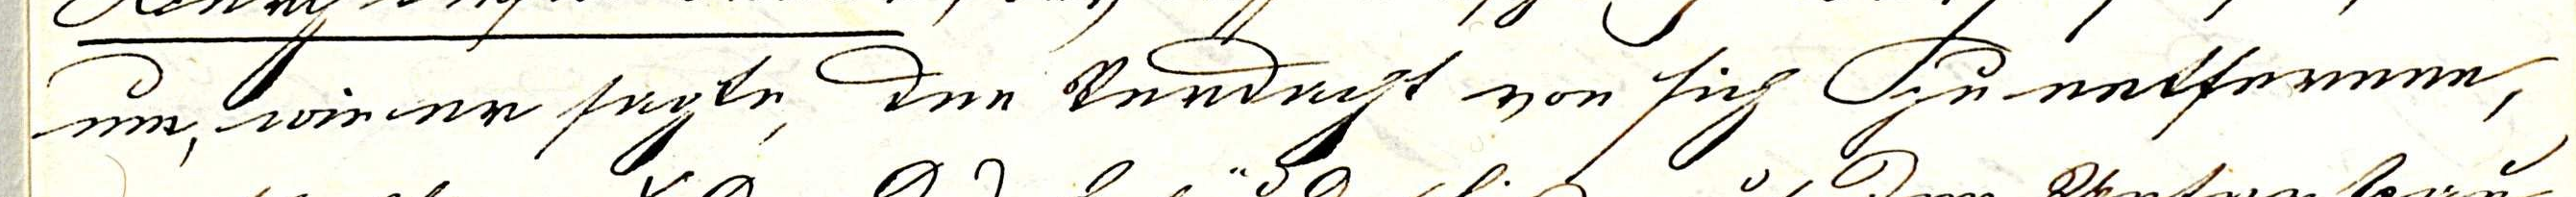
um, wie er sagte, den Verdacht von sich zu entfernen,
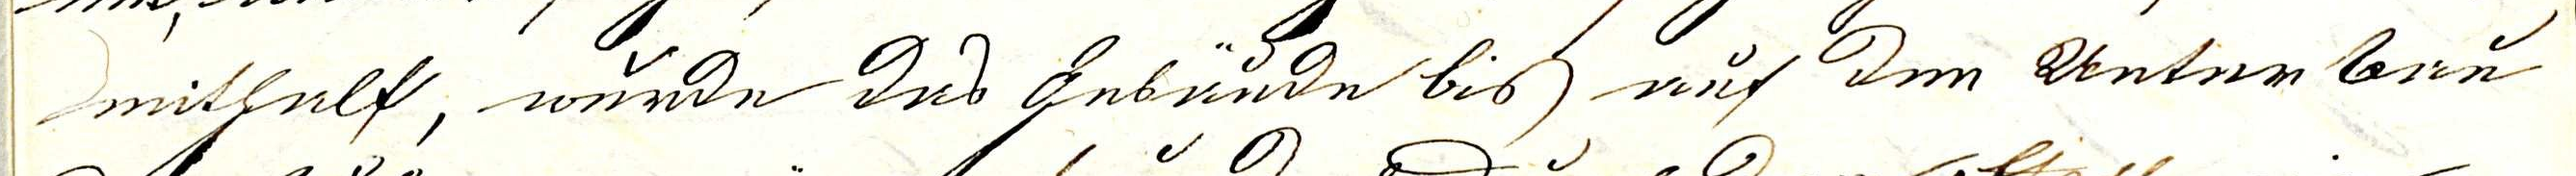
mithalf, wurde das Gebäude bis auf dem Unterbeu
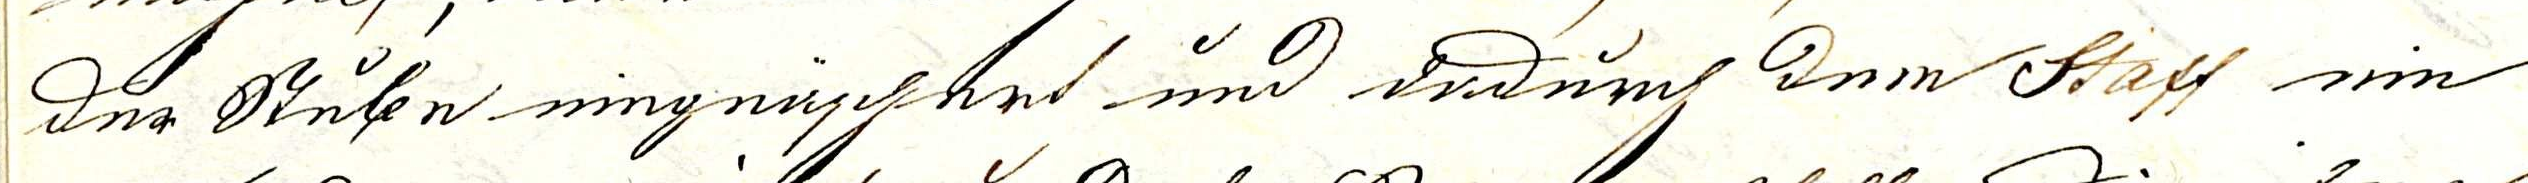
der Stube eingeäschert und dadurch dem Staff ein
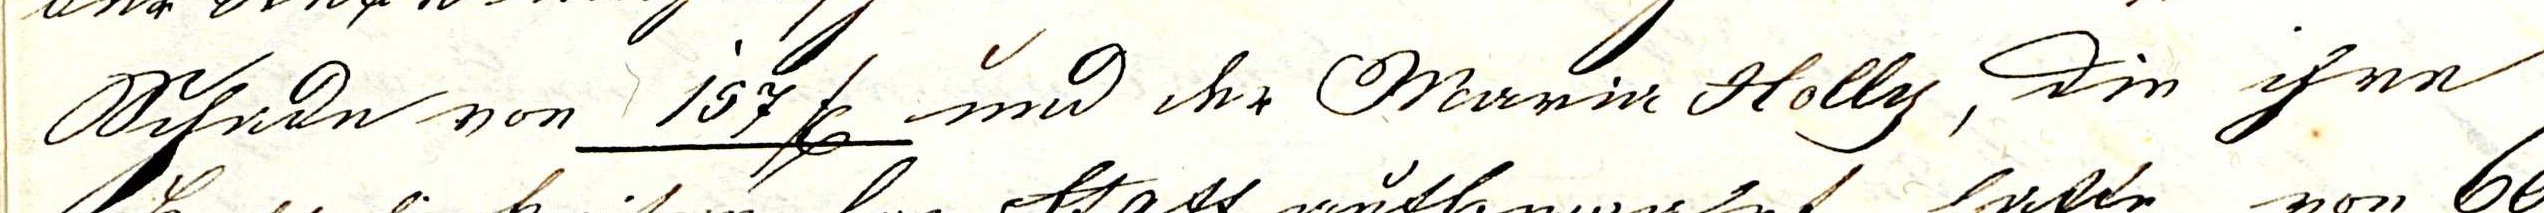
Schaden von 157 F und der Maria Holly, die ihre
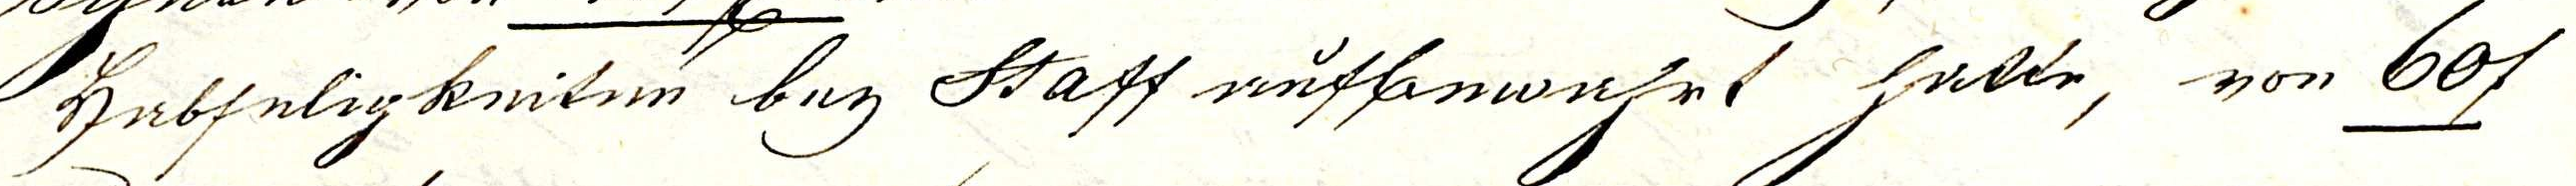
Habseligkeiten bey Staff aufbewahrt hatte, von 60f
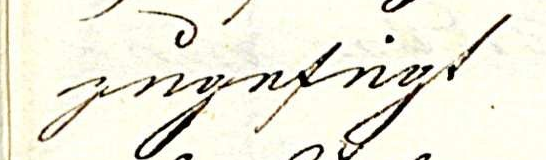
zugefugt.
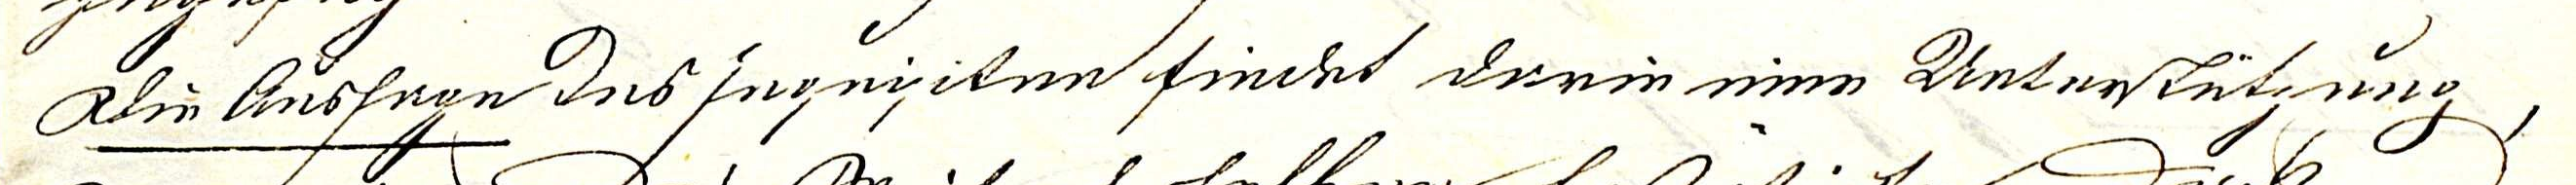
Die Aussage des Inquisiten findet darin eine Unterstützung,
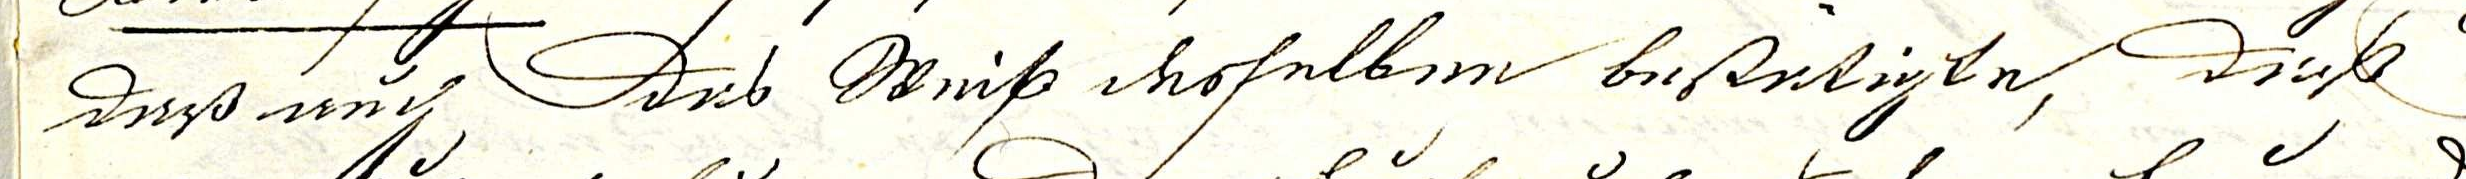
daß auch das Weib desselben bestätigte, daß
